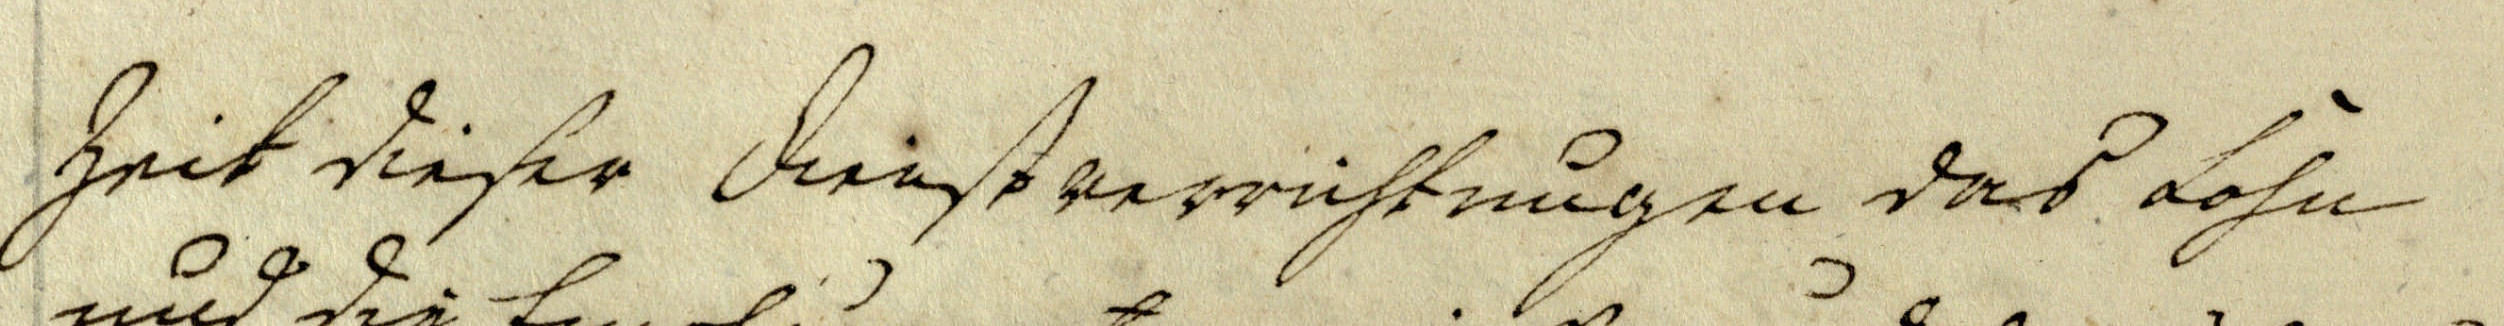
Zeit dieser Dienstverrichtungen das Lohn
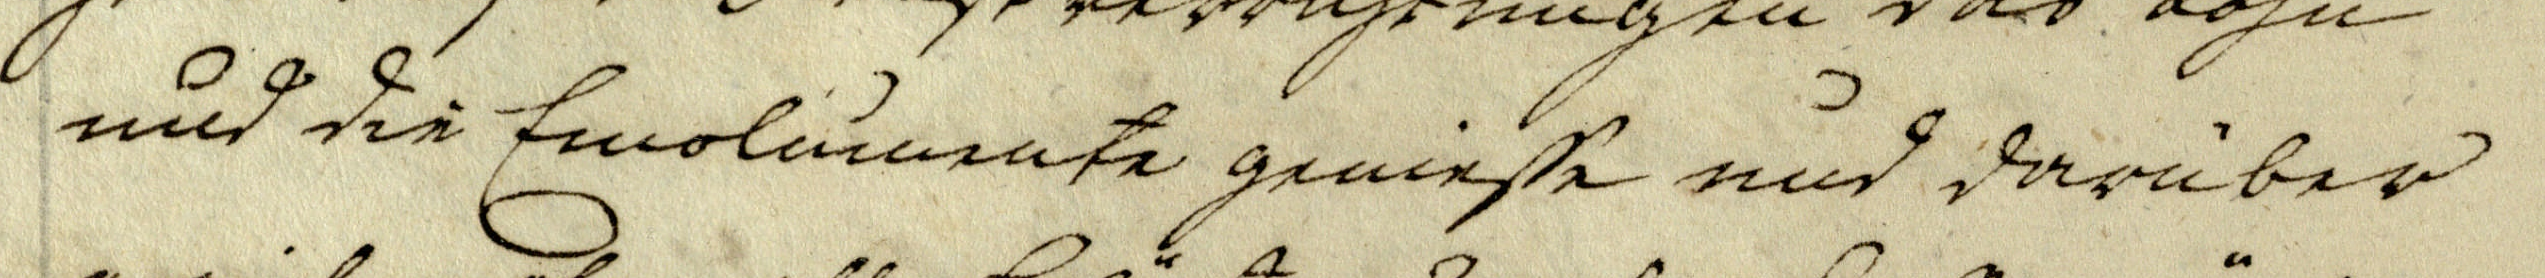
und die Emolumente geniesse und darüber
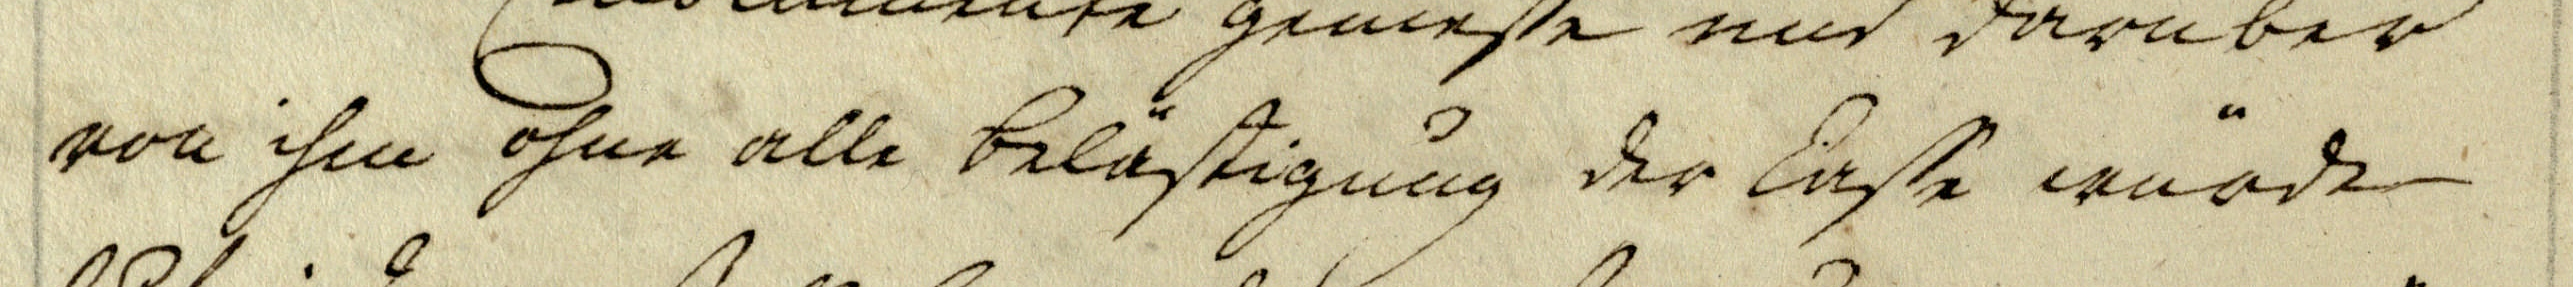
von ihm ohne alle Belästigung der Casse würde
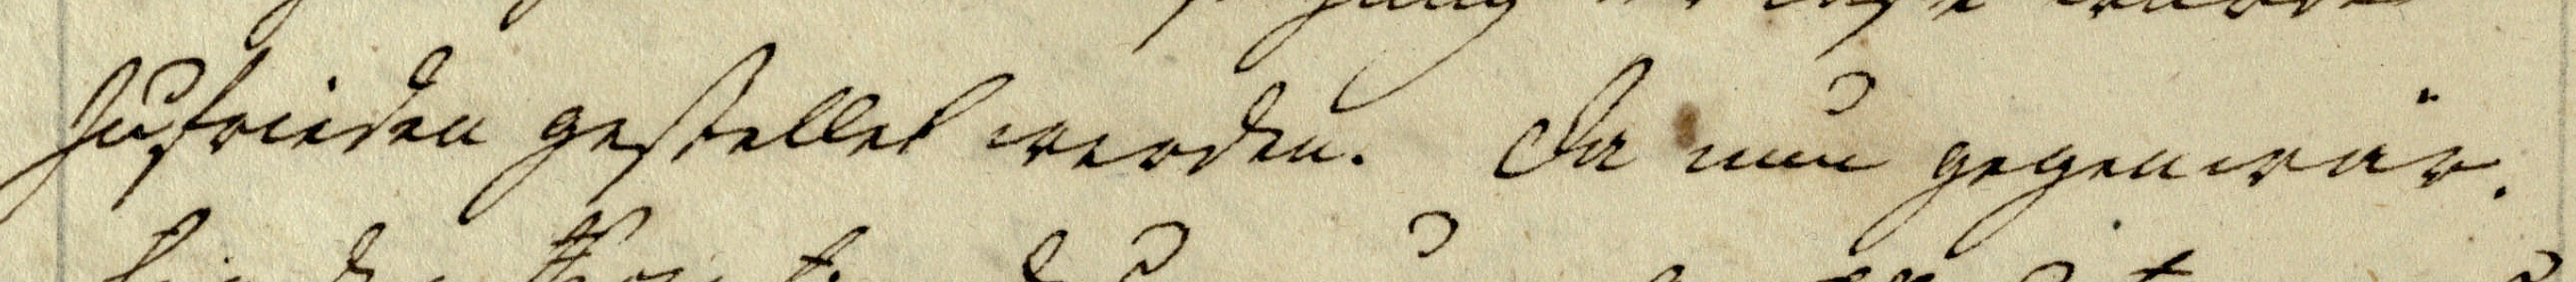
zufrieden gestellet werden. Da nun gegenwär¬
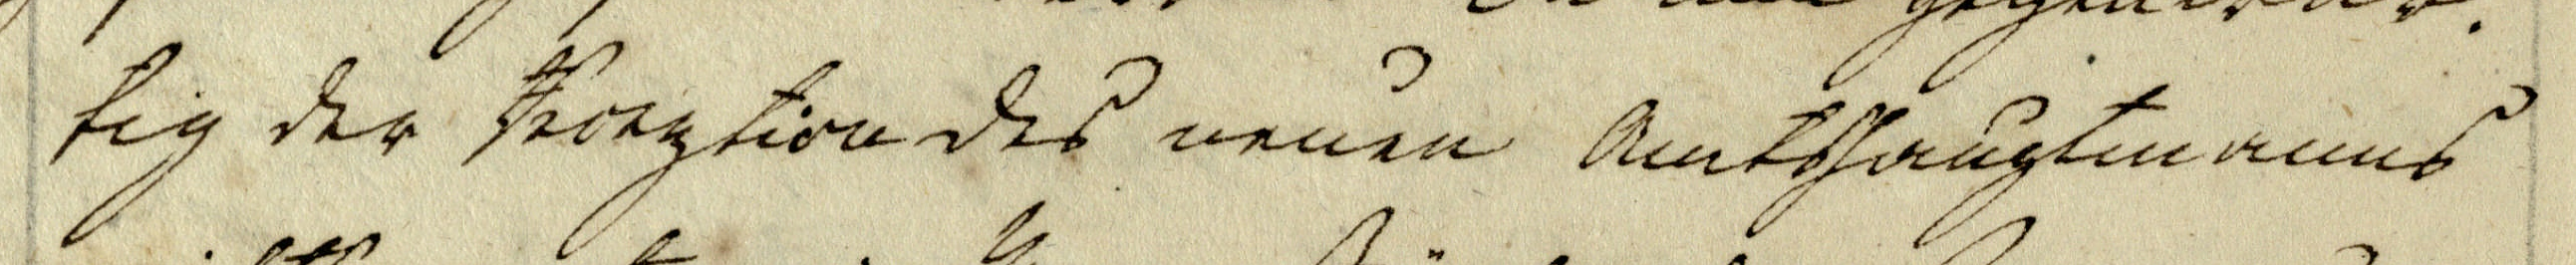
tig der Reception des neuen Amtshauptmanns
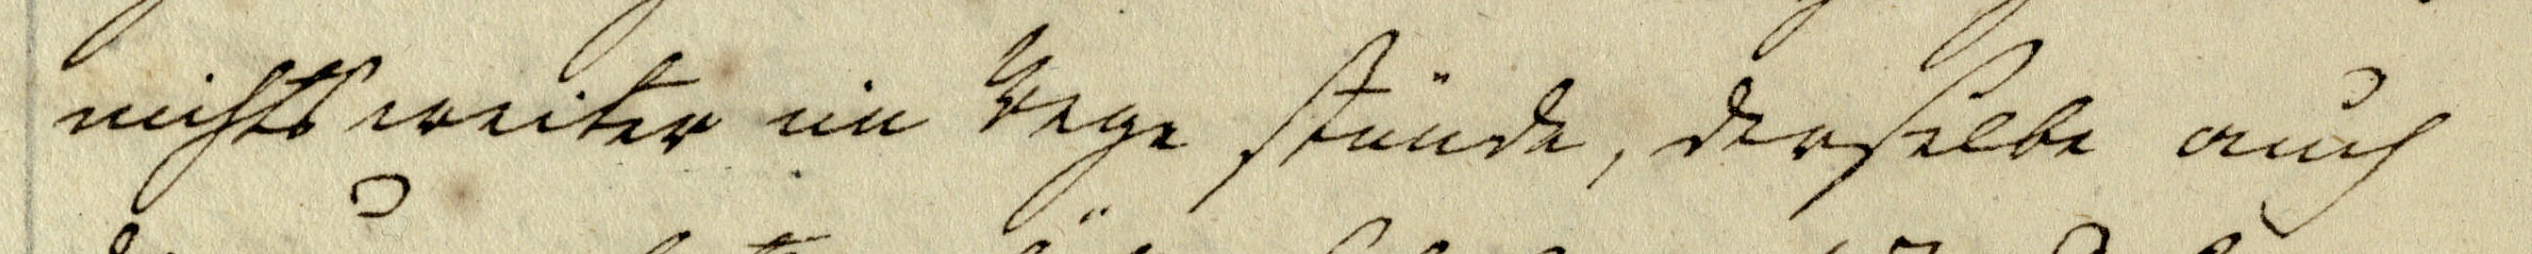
nichts weiter im Wege stünde, derselbe auch
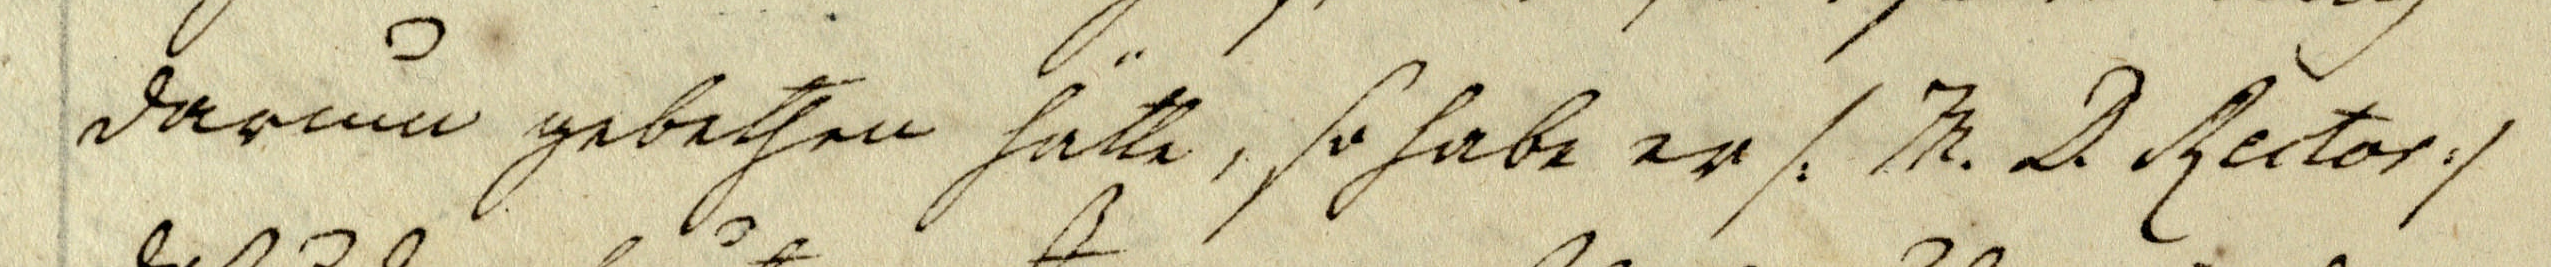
darum gebethen hätte, so habe er /: M. D. Rector :/
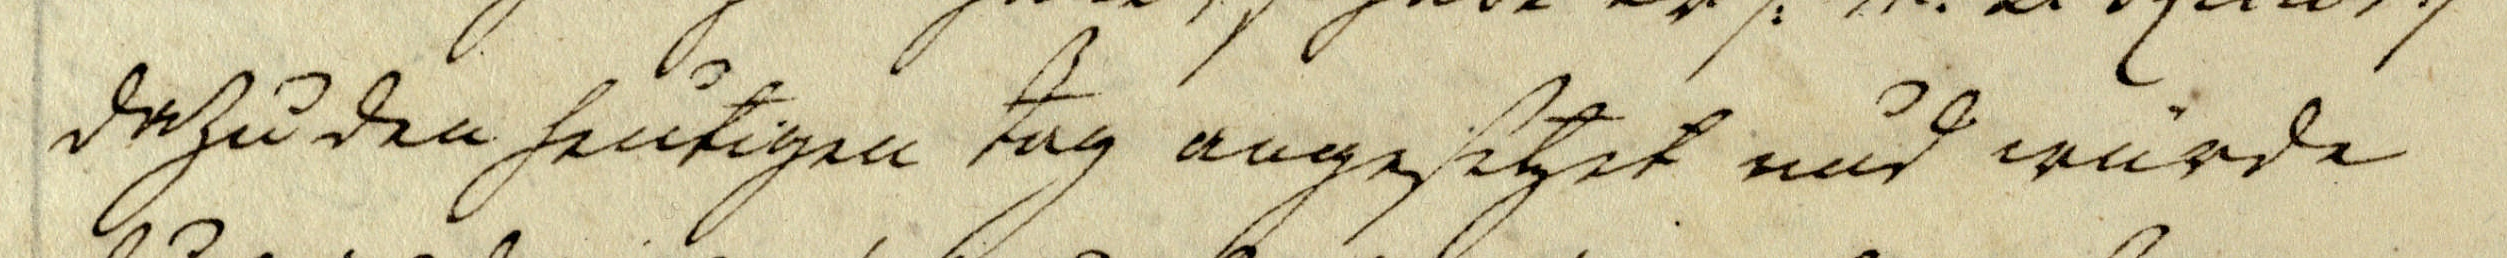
dazu den heutigen Tag angesetzet und würde
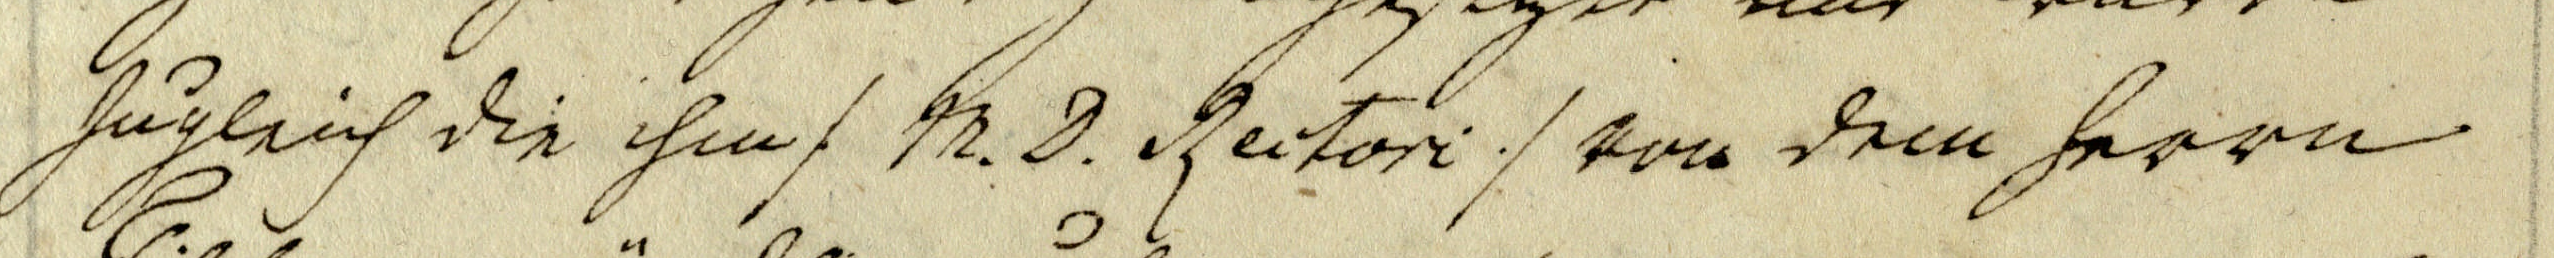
zugleich die ihm /: M D. Rectori ./ von dem Herrn
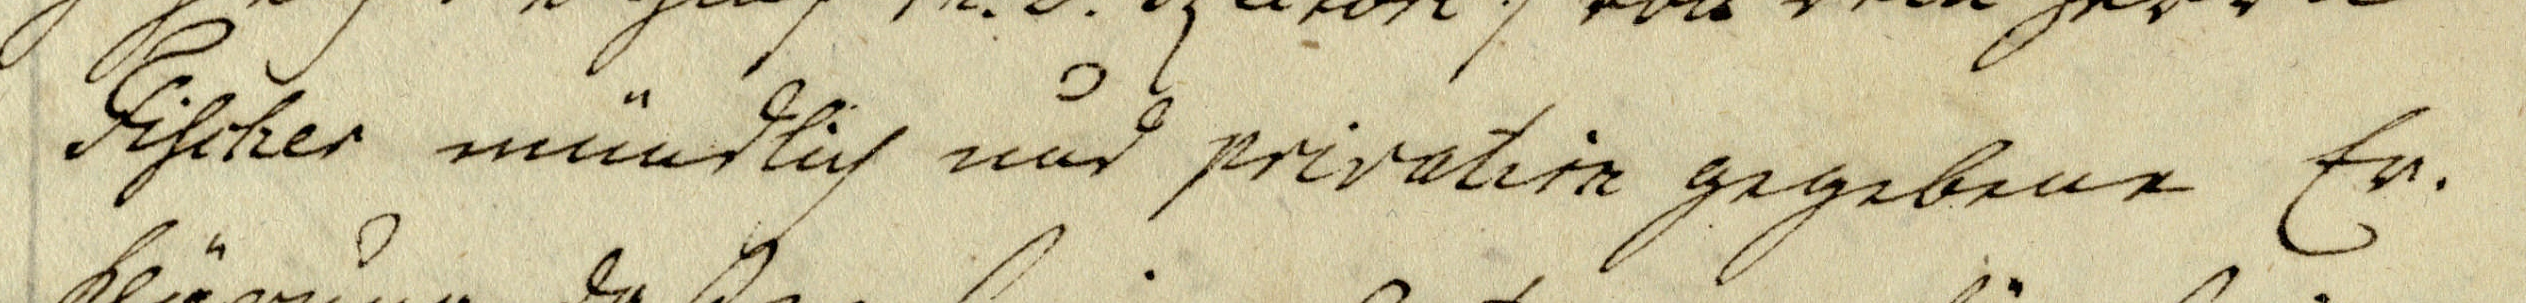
Fischer mündlich und privatim gegebene Er¬
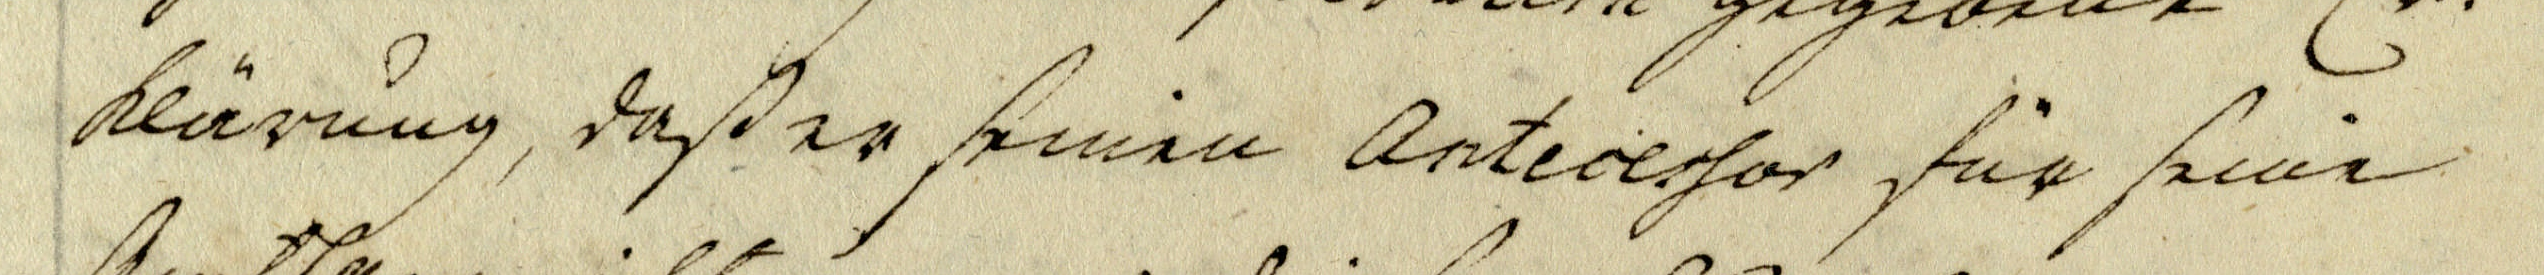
klärung, daß er seinen Antecessor für seine
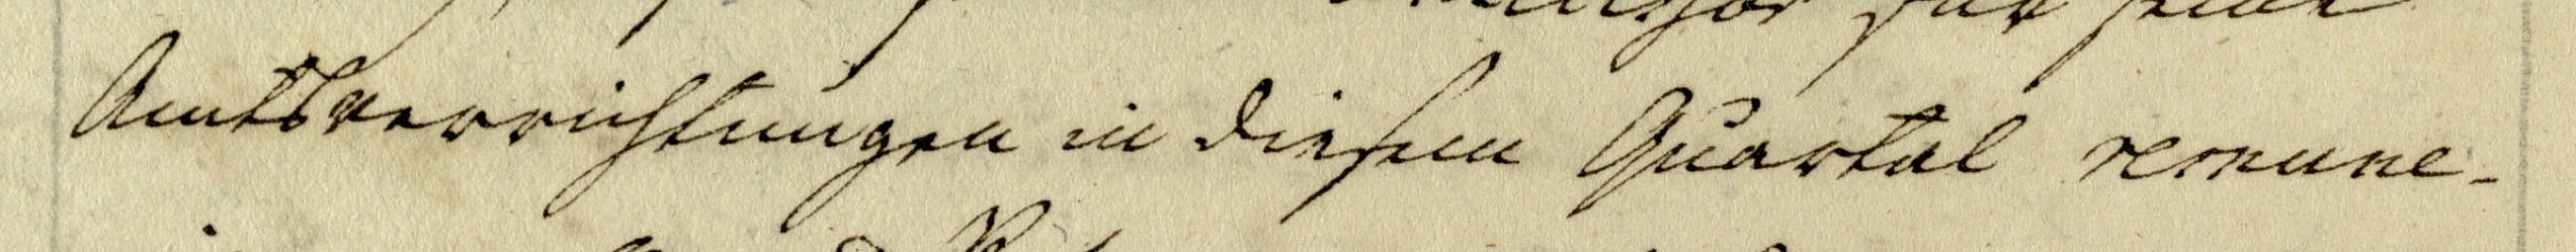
Amtsverrichtungen in diesem Quartal remune¬
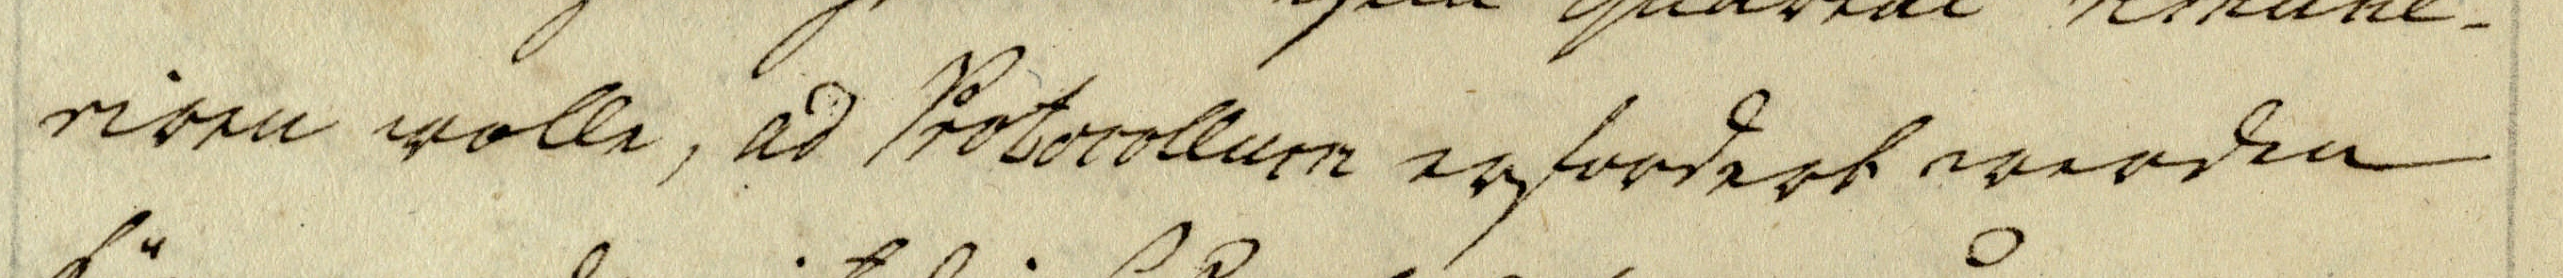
riren wolle, ad Protocollum erfordert werden
